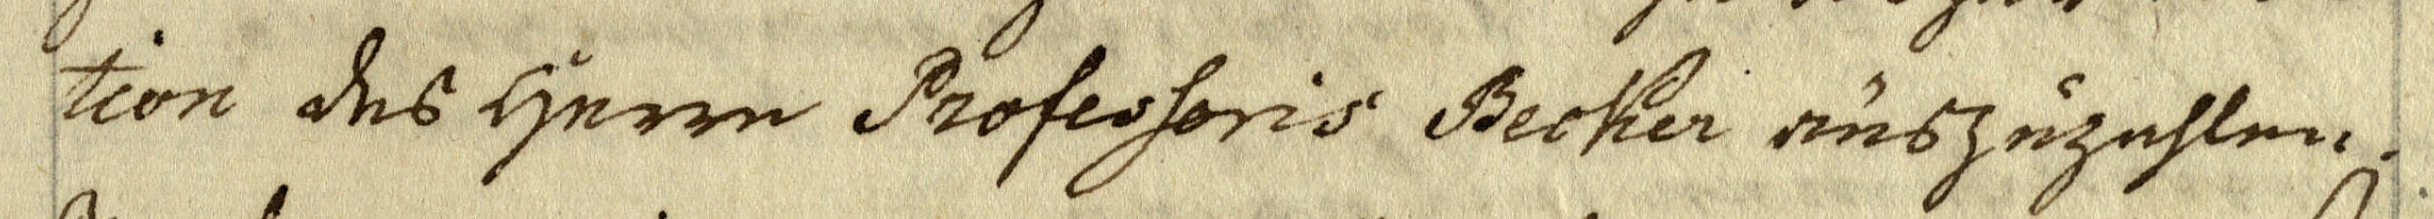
tion des Herrn Professoris Becker auszuzahlen.
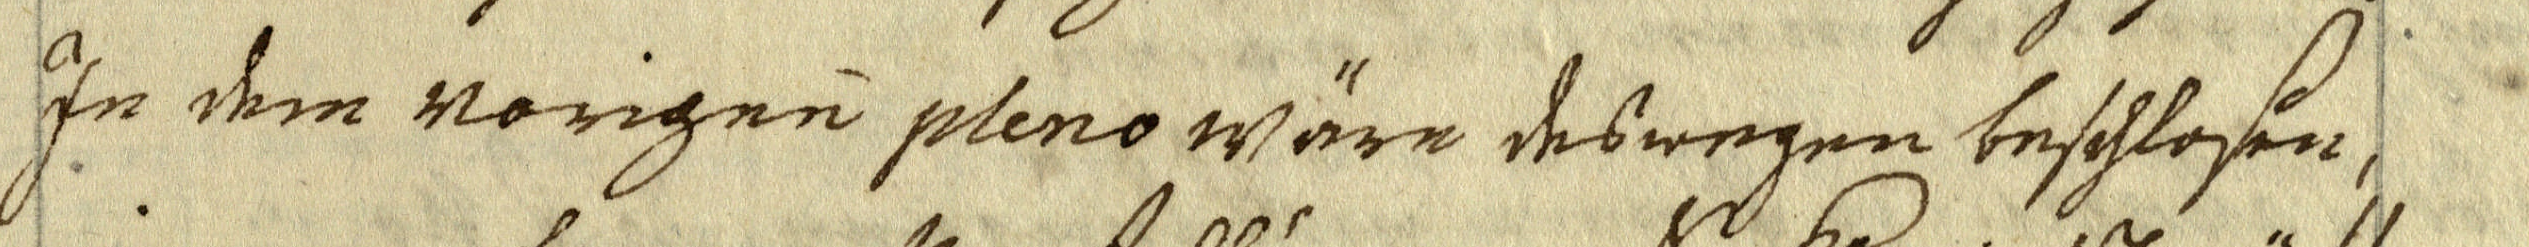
In dem vorigen pleno wäre deswegen beschloßen,
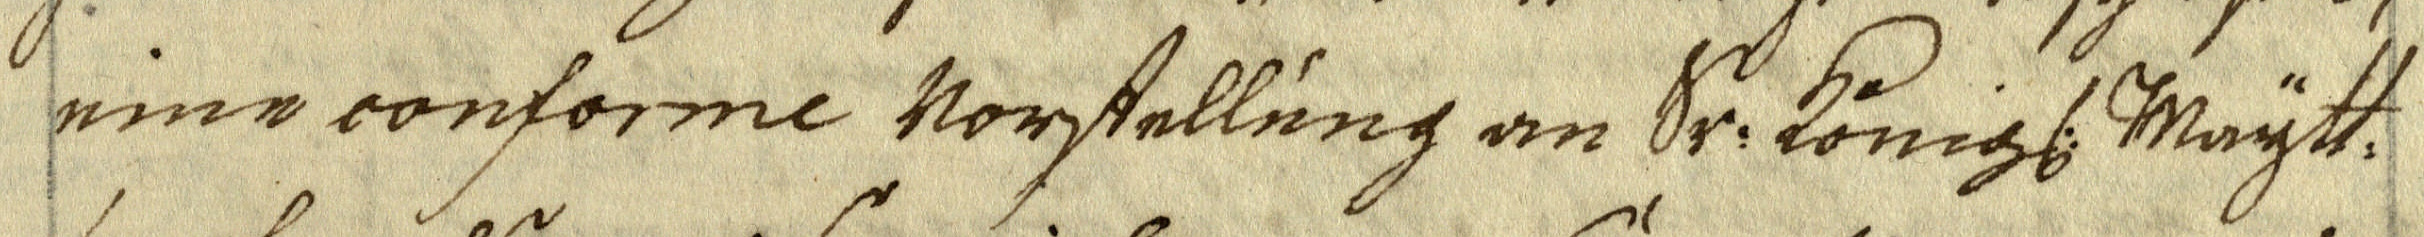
eine conforme Vorstellung an Sr: Königl: Maÿst.
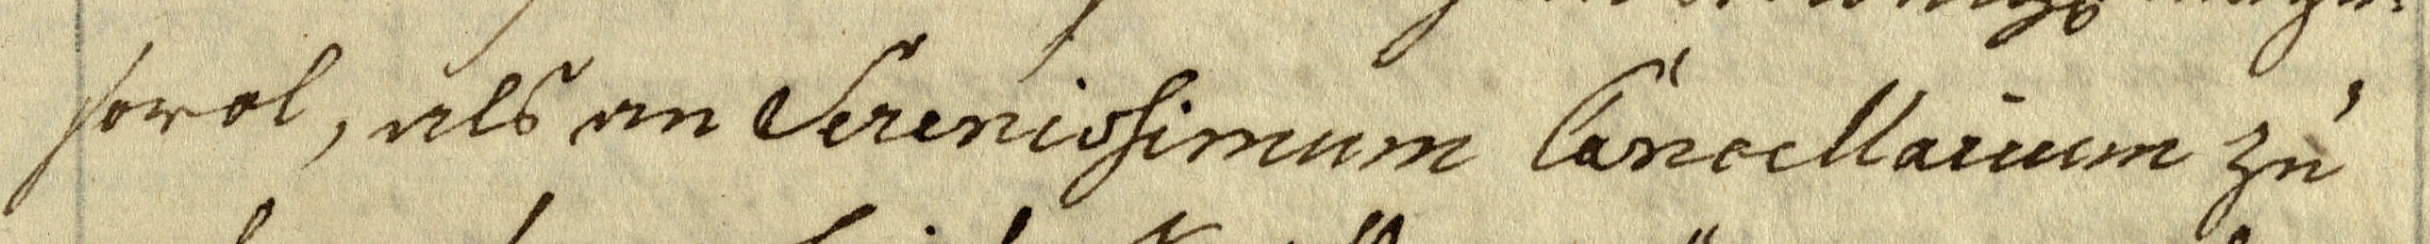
sowol, als an Serenissimum Cancellarium zu
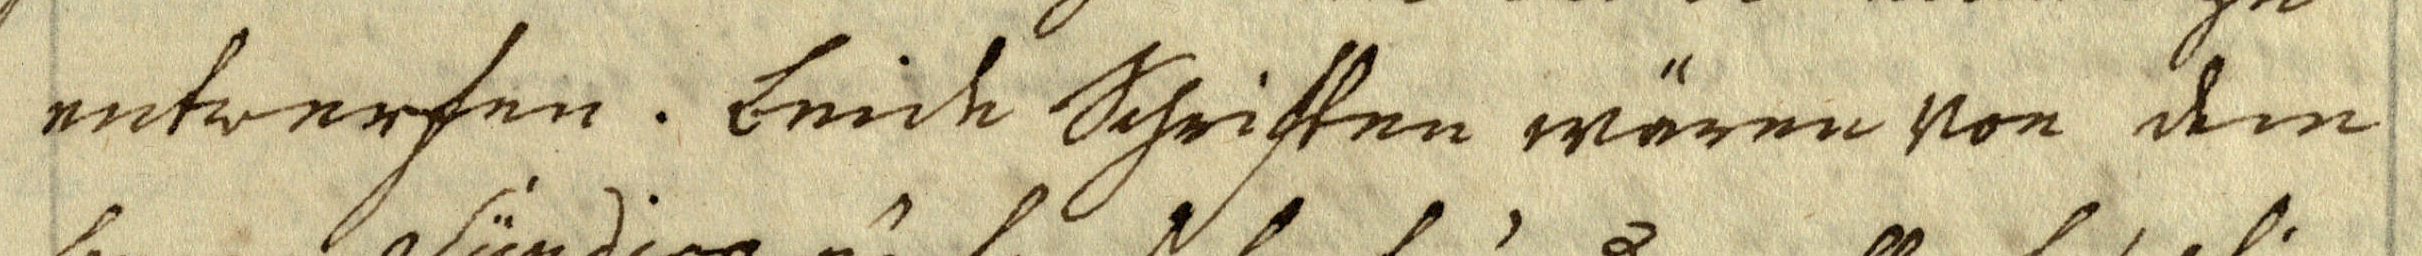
entwerfen. Beide Schriften wären von dem
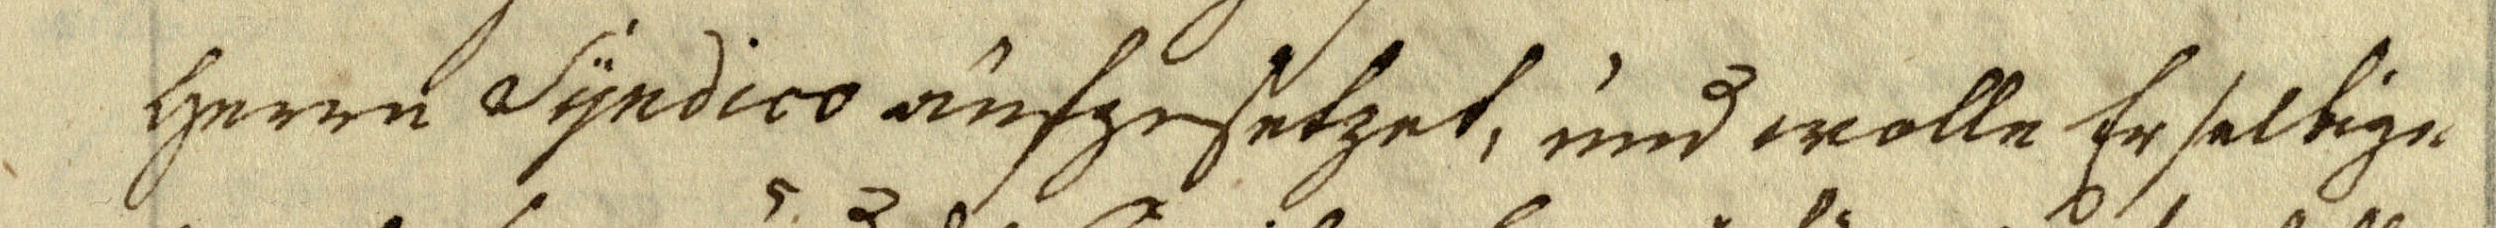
Herrn Sÿndico aufgesetzet, und wolle Er selbige
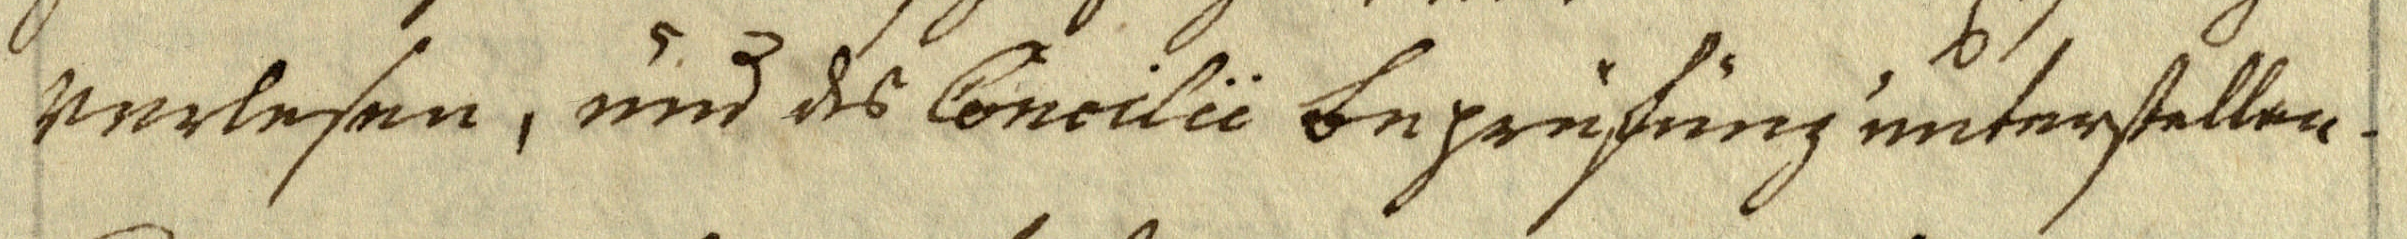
verlesen, und des Concilii Beprüfung unterstellen.
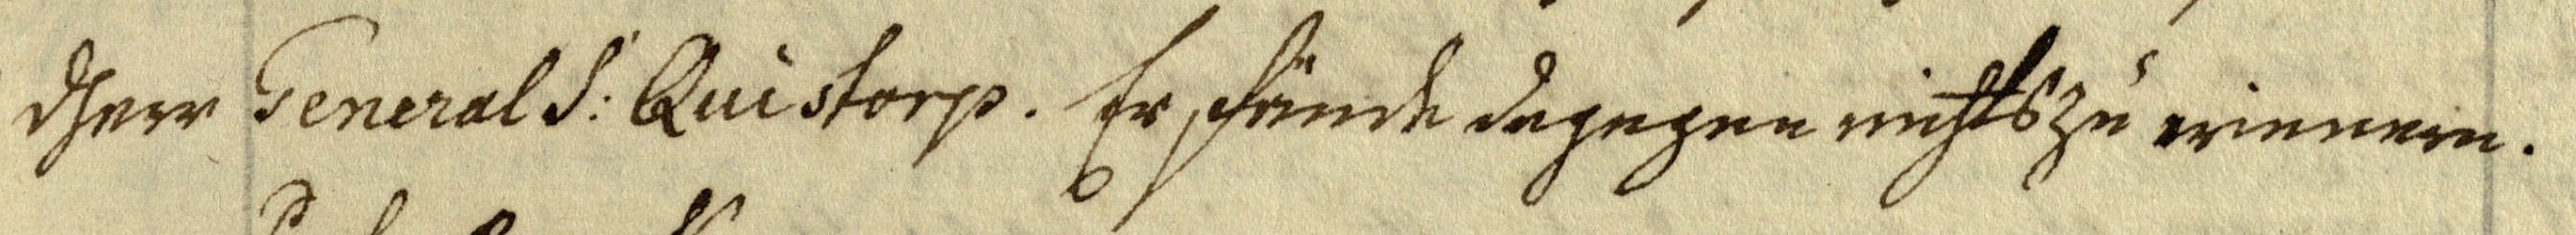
Herr General S: Quistorp. Er fände dagegen nichts zu erinnern.
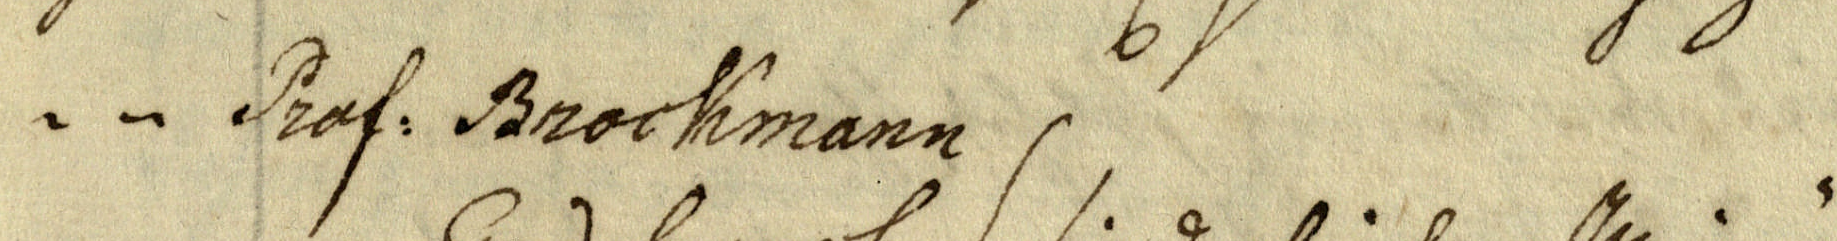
Prof: Brockmann
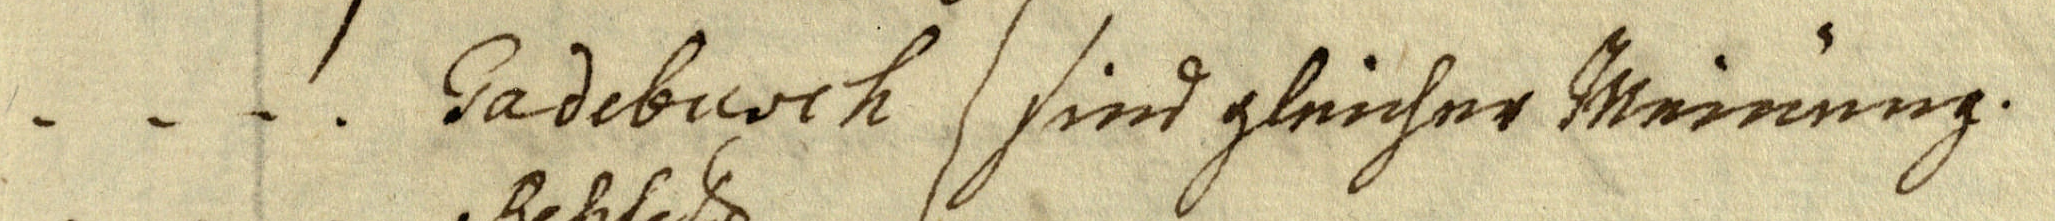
Gadebusch sind gleicher Meinung
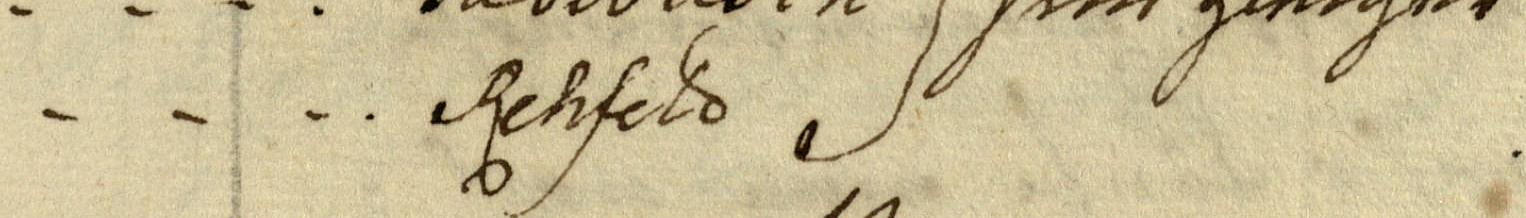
Rehfeld
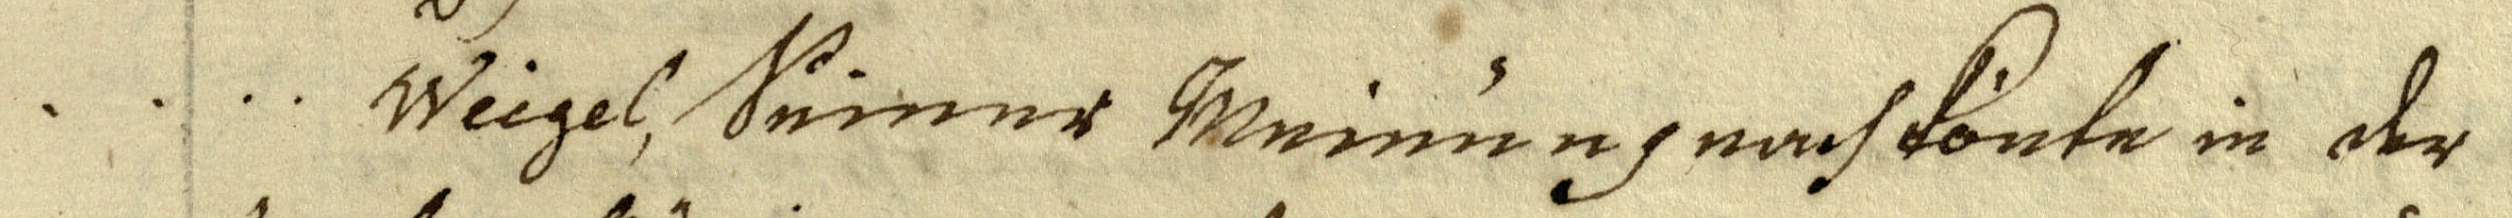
Weigel, Seiner Meinung nach könte in der
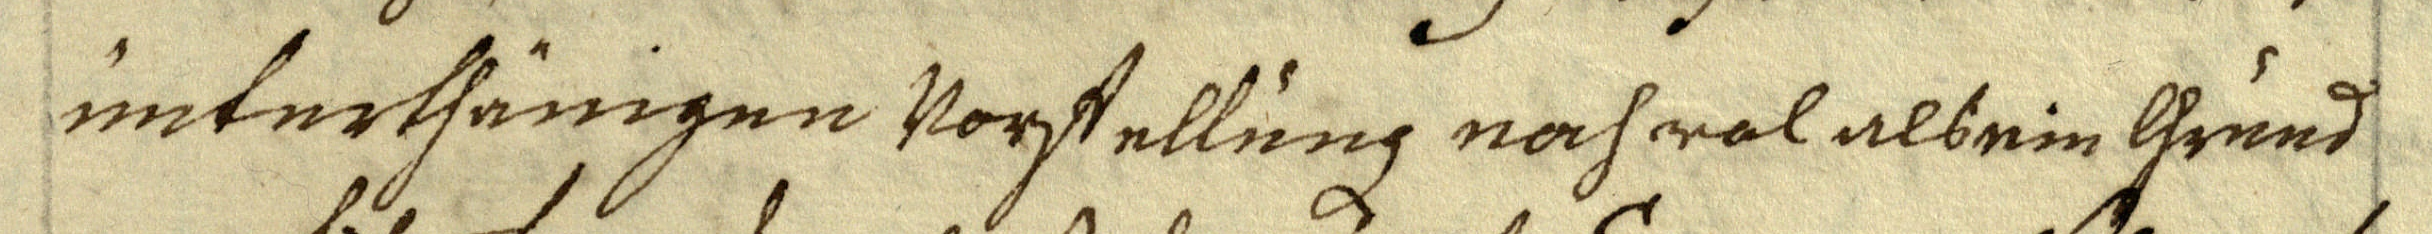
unterthänigen Vorstellung nach wol als ein Grund
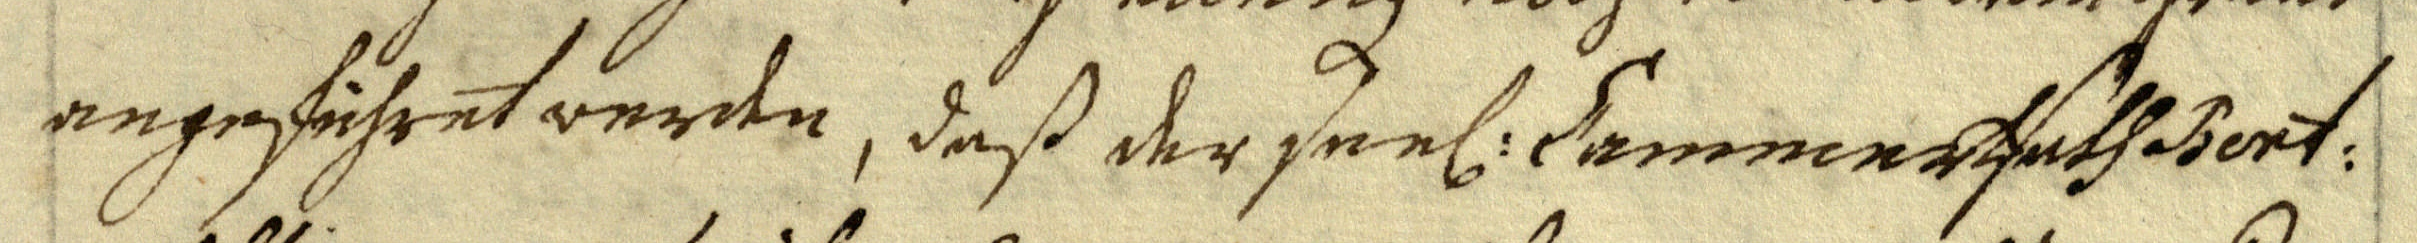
angeführet werden, daß der seel: CammerRath Bent¬
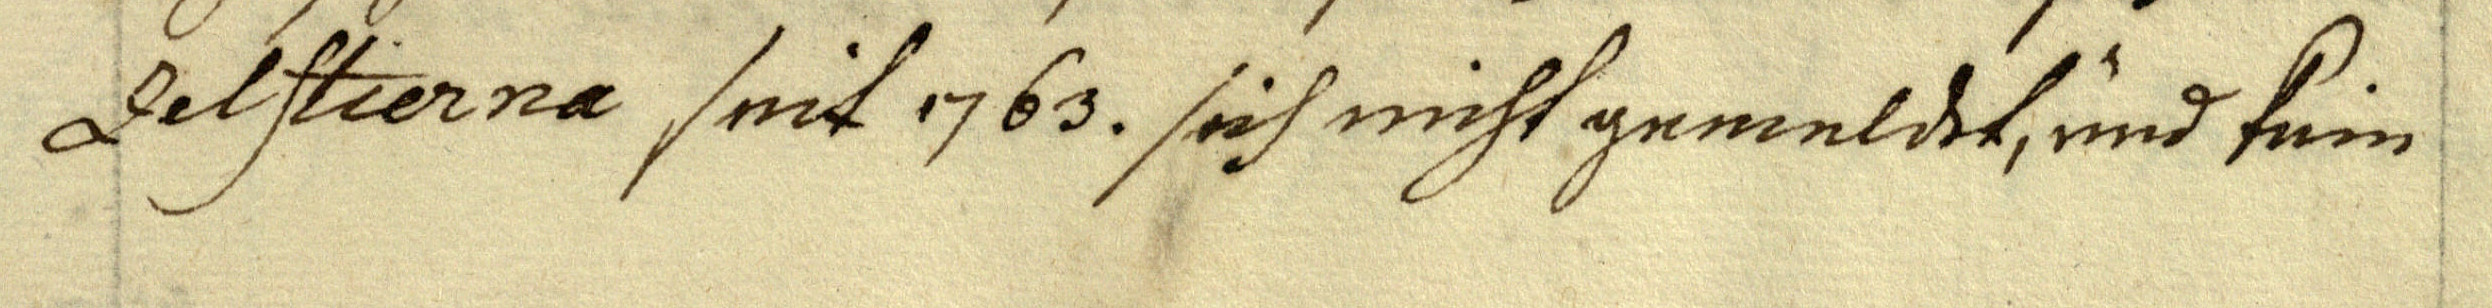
zelstierna seit 1763. sich nicht gemeldet, und kein
